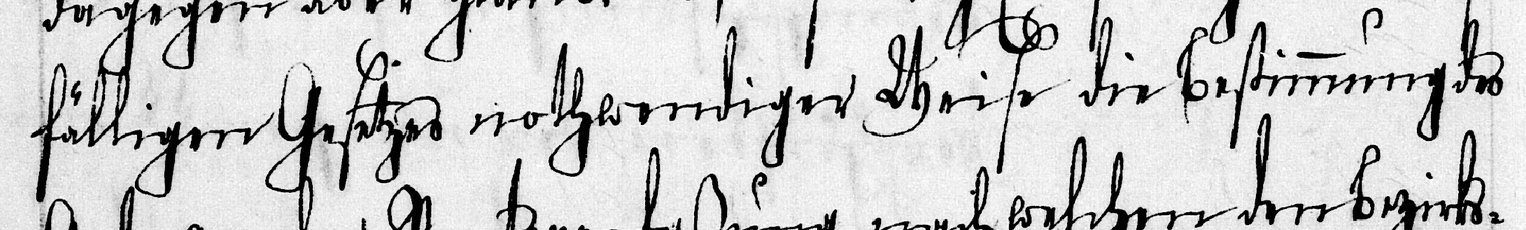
fälligen Gesetzes nothwendiger Weise die Bestimmung des
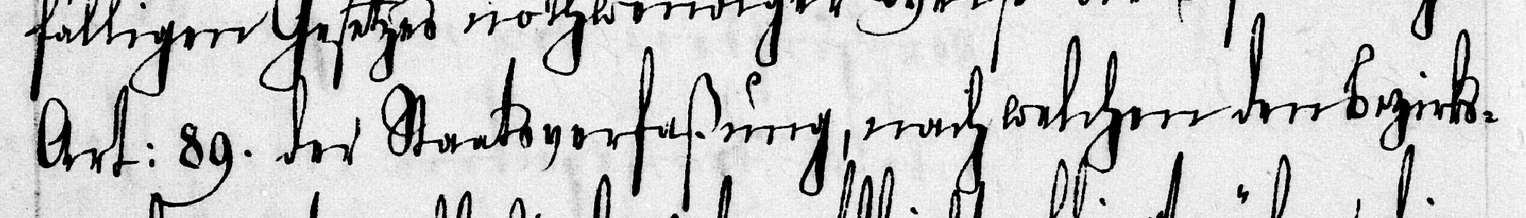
Art: 89. der Staatsverfaßung, nach welchen den Bezirks-
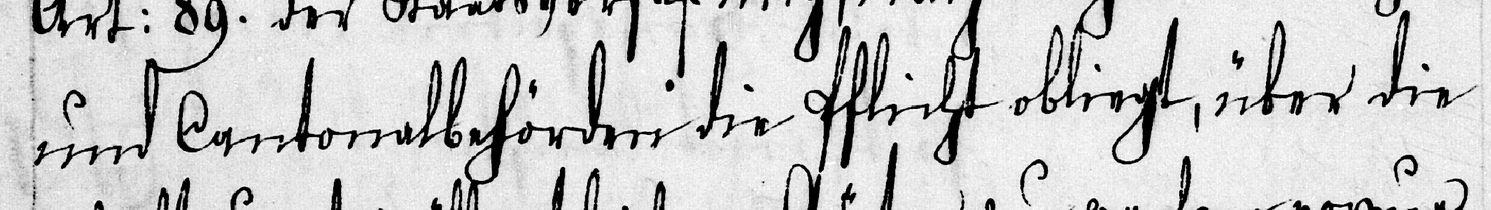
und Cantonalbehörden die Pflicht obliegt, über die
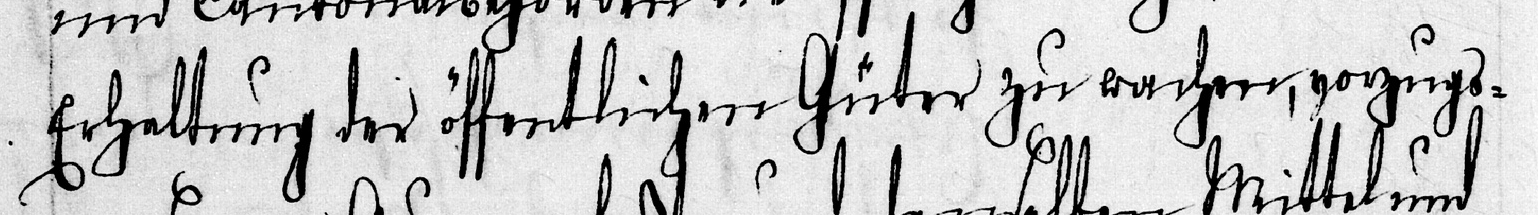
Erhaltung der öffentlichen Güter zu wachen, vorzugs¬
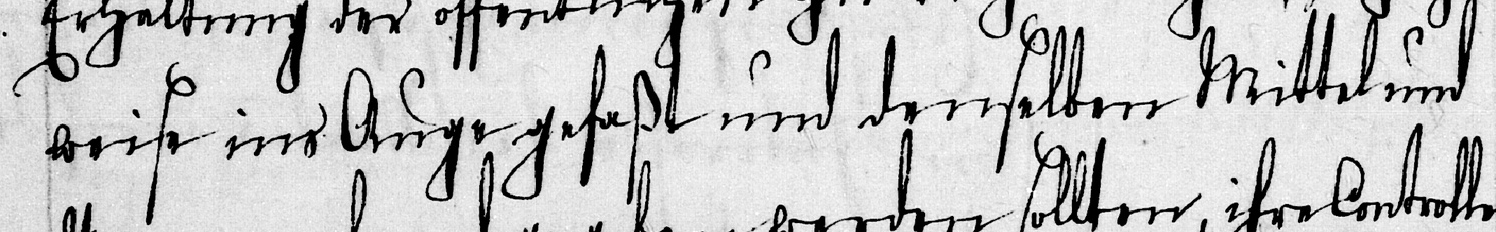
weise ins Auge gefaßt und denselben Mittel und
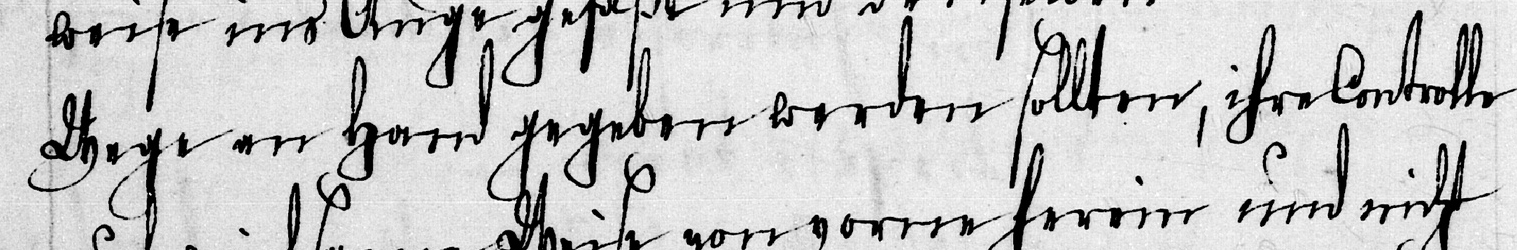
Wege an Hand gegeben werden sollten, ihre Control¬
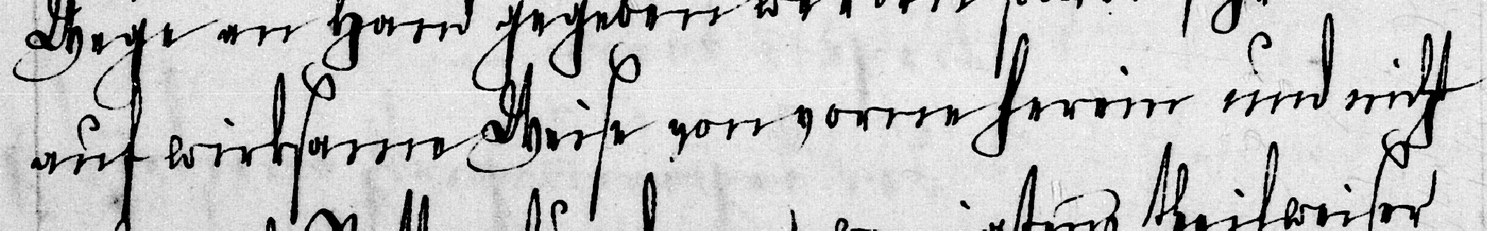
auf wirksame Weise von vorne herein und nicht
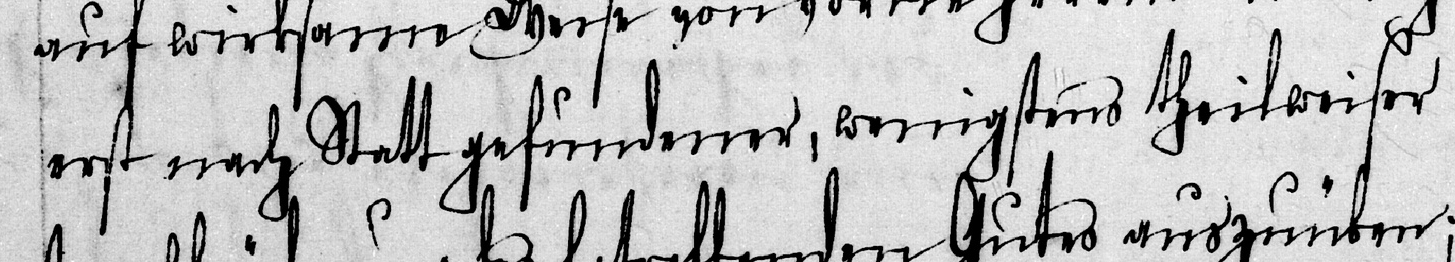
erst nach Statt gefundener, wenigstens theilweiser
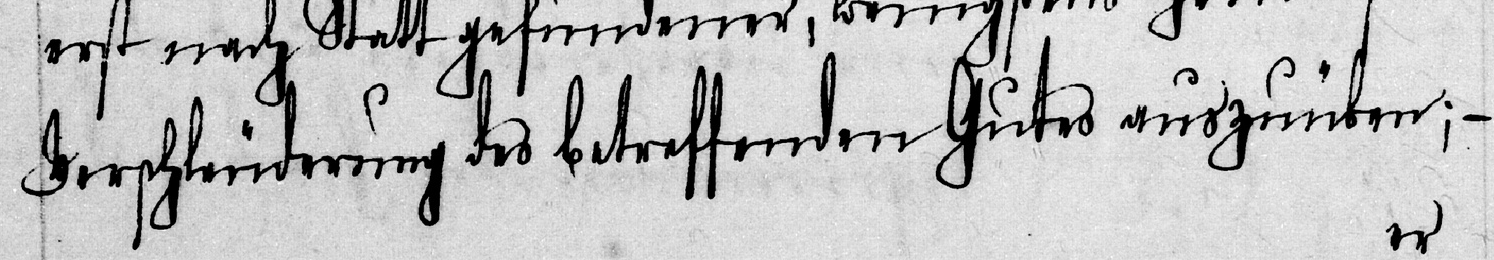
Verschleuderung des betreffenden Gutes auszuüben;
